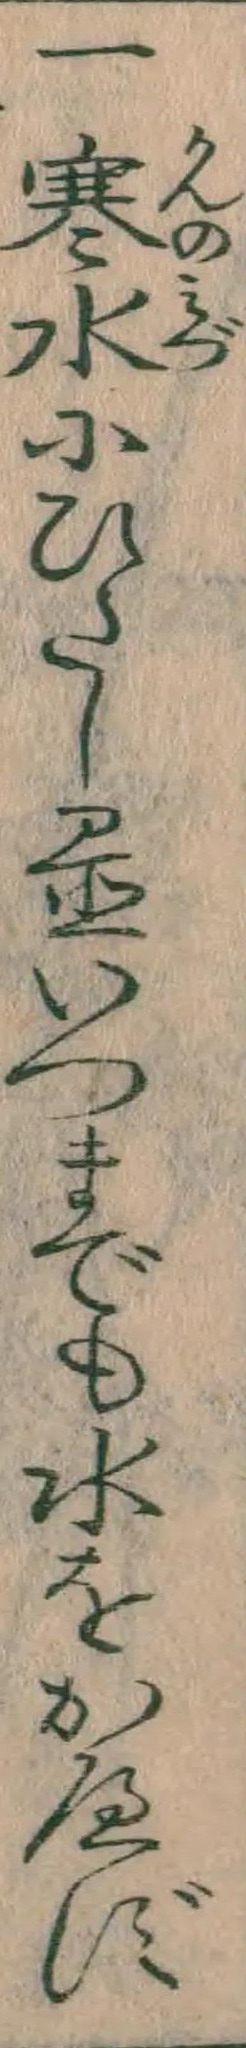一寒水にひたし置いつまでも水をかへず
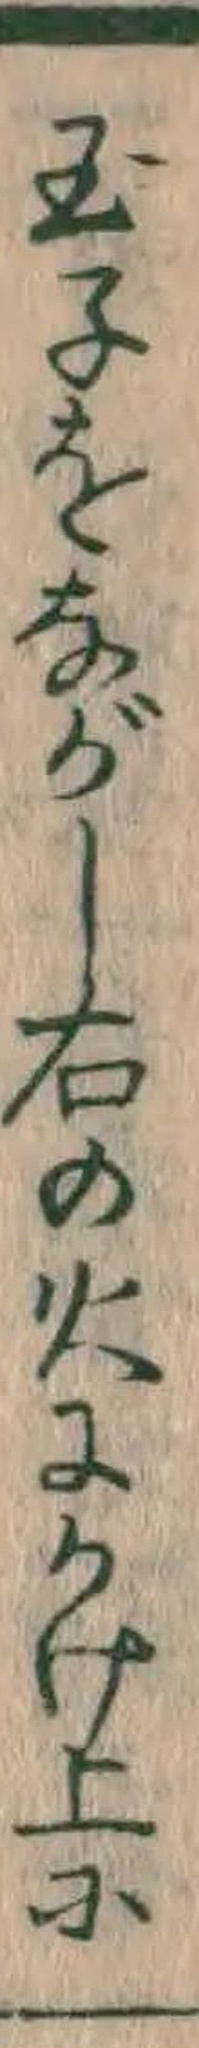玉子をながし右の火にかけ上に
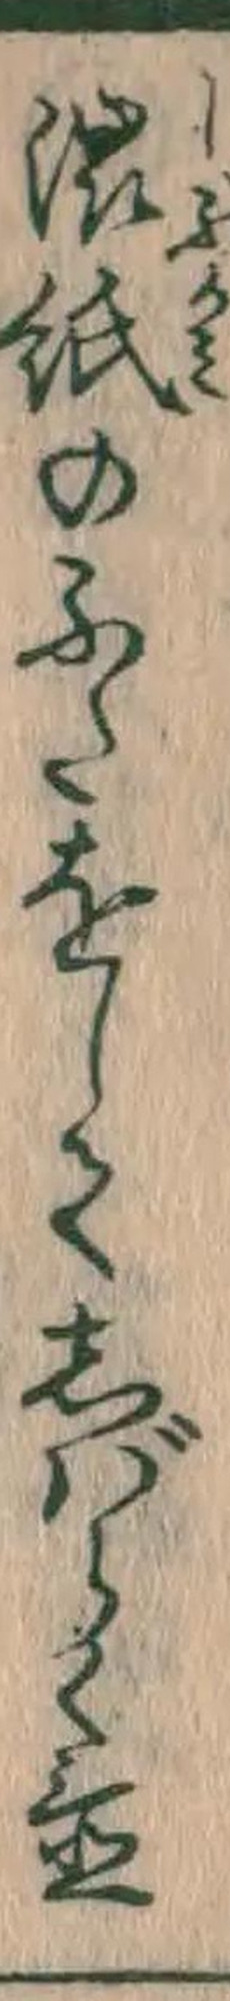渋紙のふたをしてしばらく置
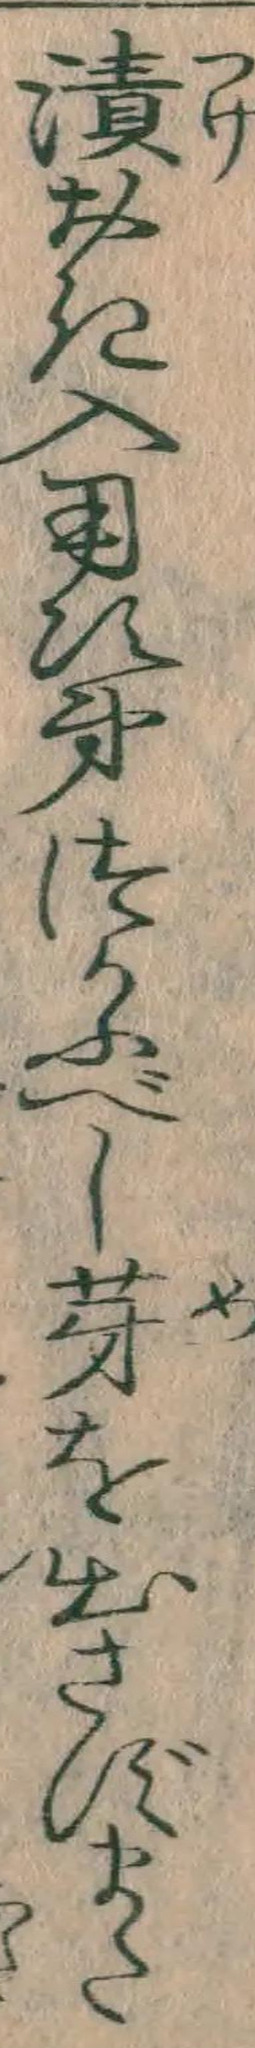漬おき入用次第つかふべし芽を出さずまた
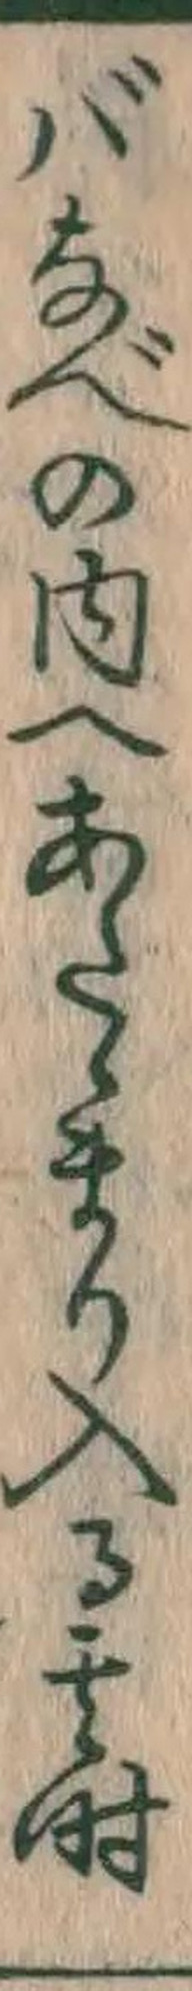ばなべの内へあたゝまり入る其時
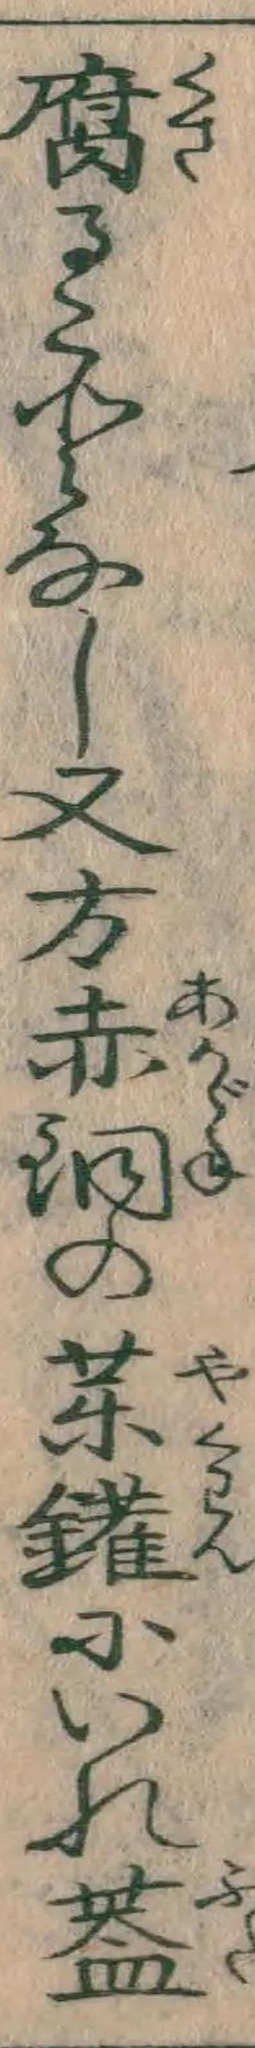腐ることなし又方赤銅の薬鑵にいれ蓋
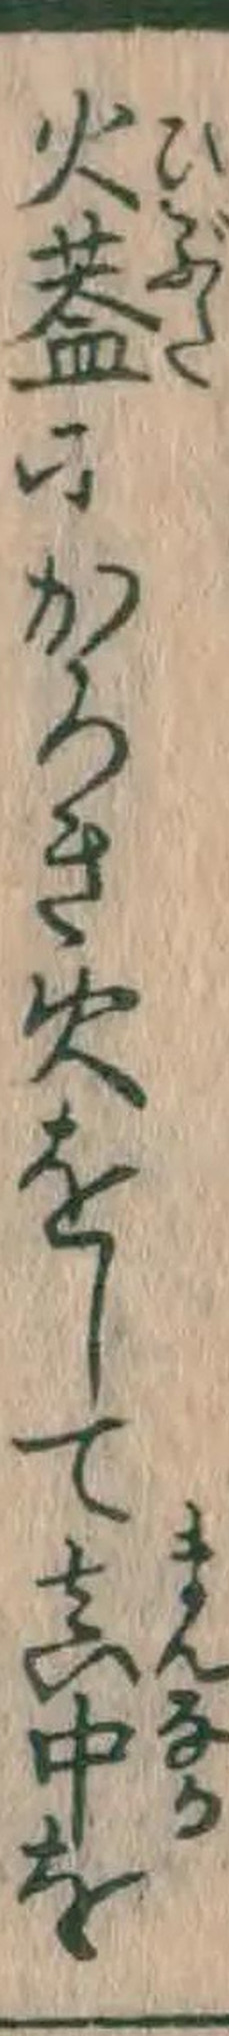火蓋にかろき火をして真中を
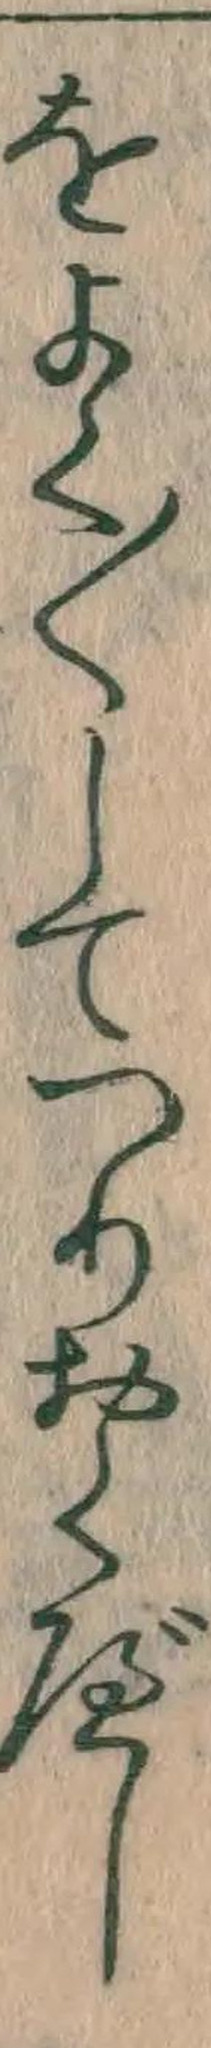をよく〳〵してつりおくべし
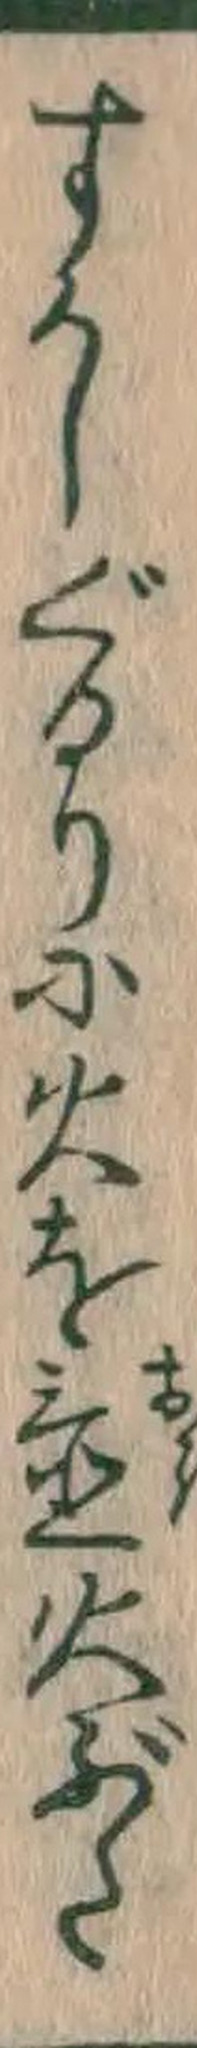すかしぐるりに火を置火ぶた
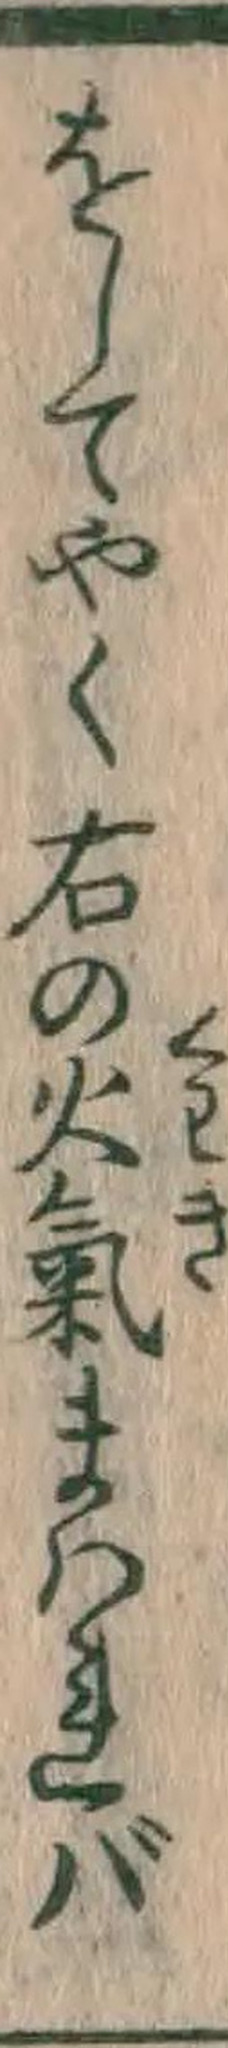をしてやく右の火気まはれば
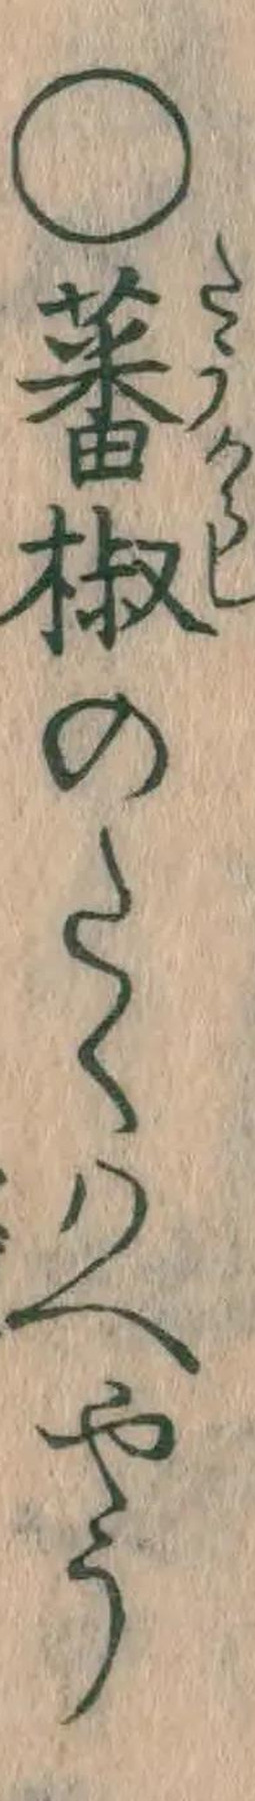○蕃椒のたくはへやう
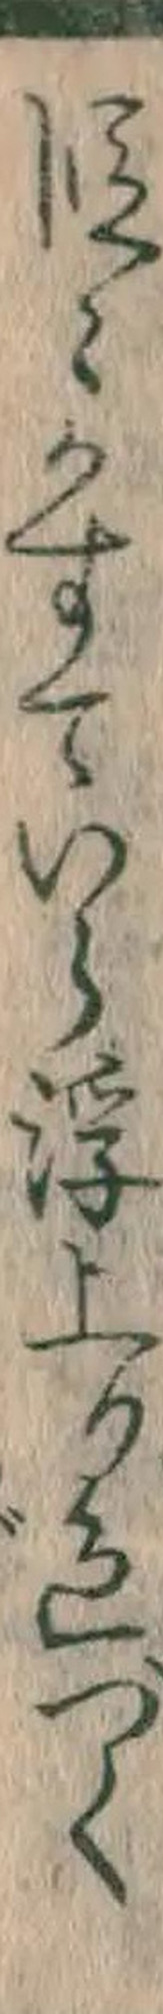段々かすていら浮上り色づく
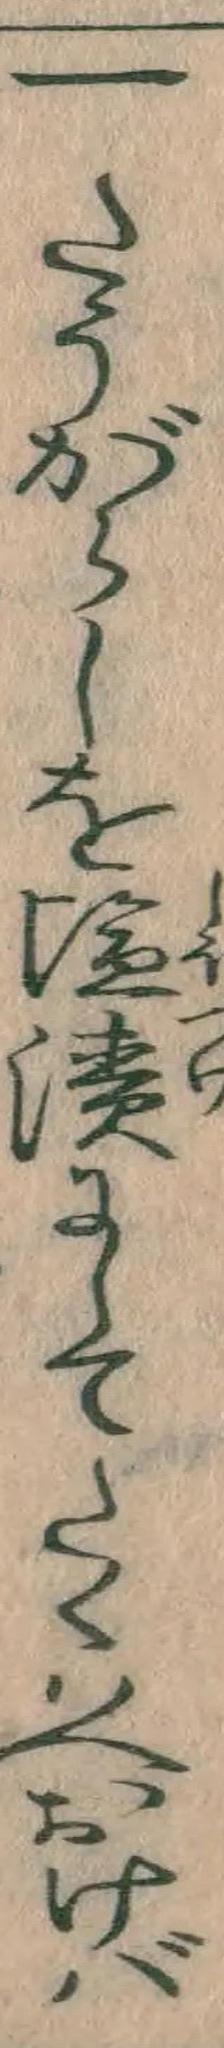一たうがらしを塩漬にしてたくはへおけば
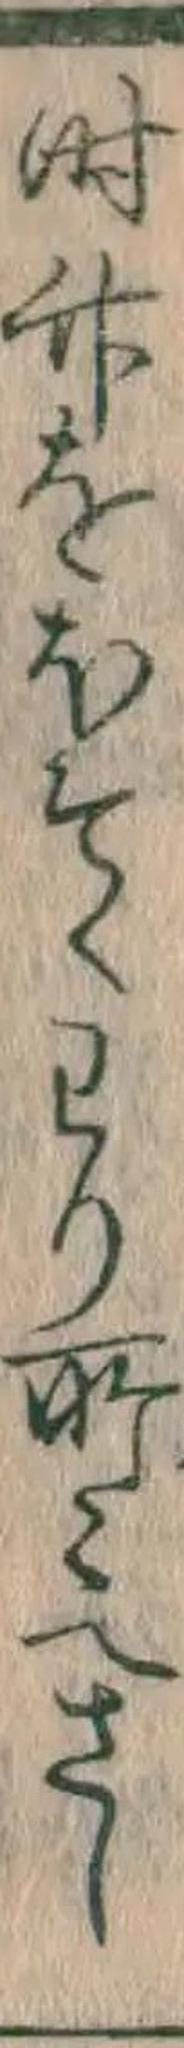時竹をほそくわり所々へさし
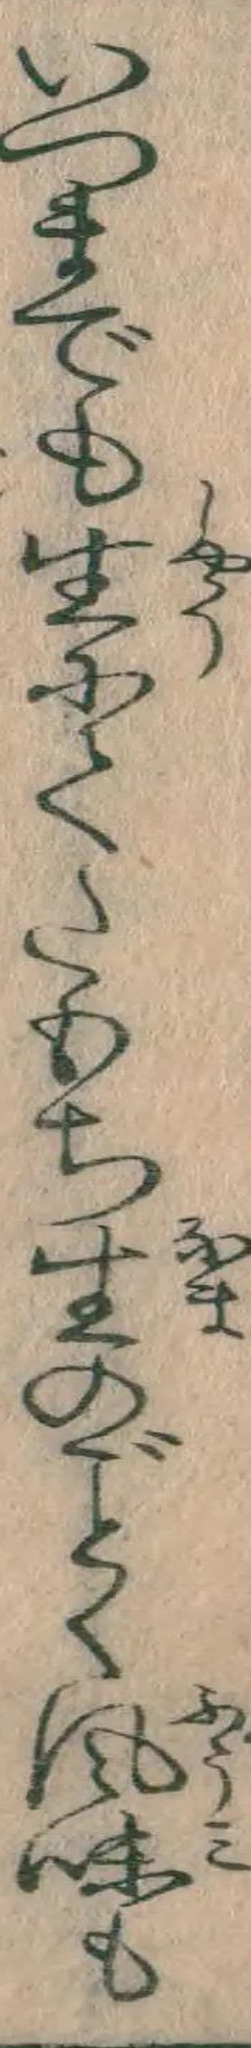いつまでも生にてたもち生のごとく風味も
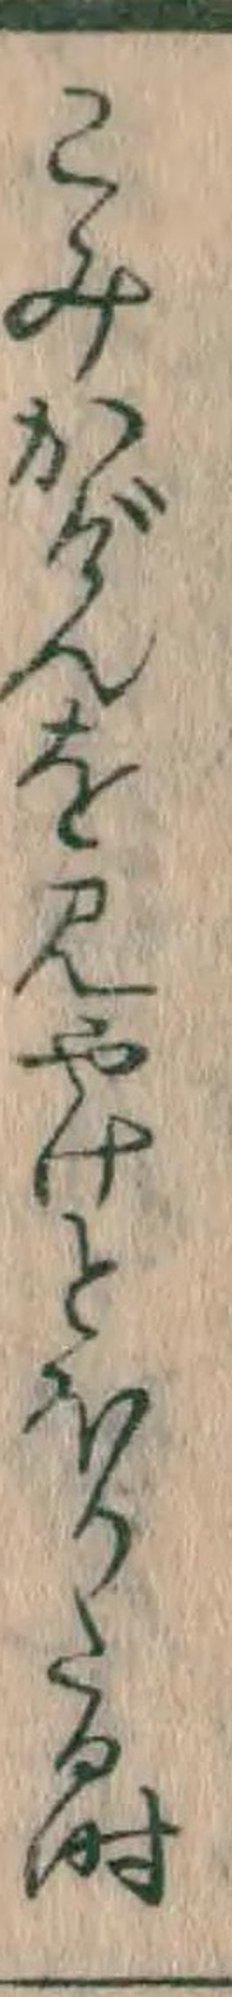こみかげんを見やけとほりたる時
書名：広益秘事大全 3巻. [5]
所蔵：国立国会図書館 National Diet Library, JAPAN
